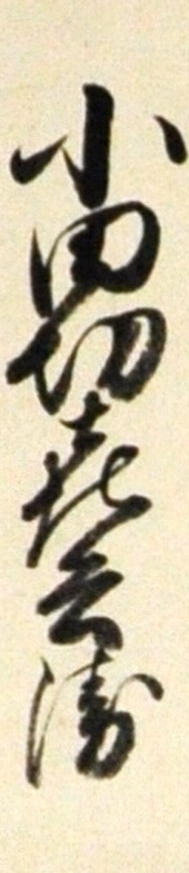小田切喜兵衛
